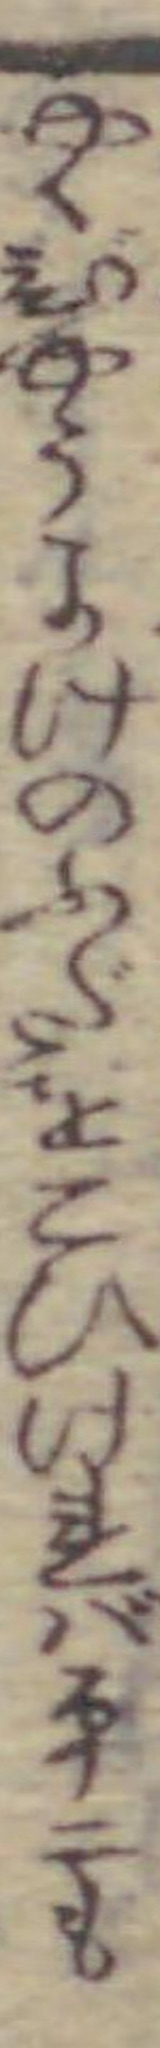やくひやうよけのふだをこひければ平二も
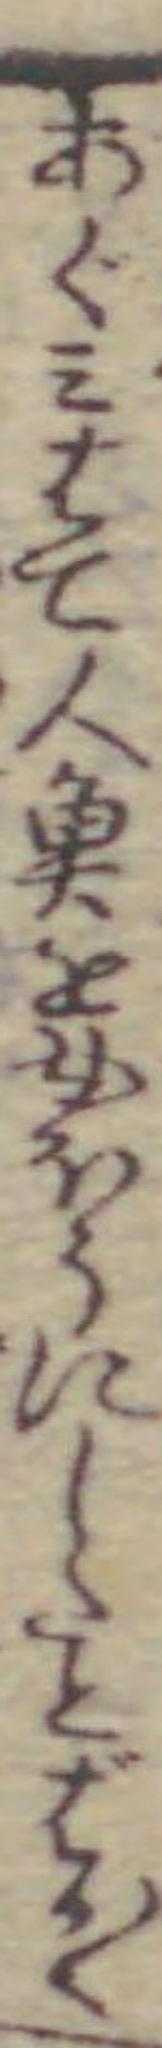あぐみはて人魚を女ほうにしたことばか〳〵
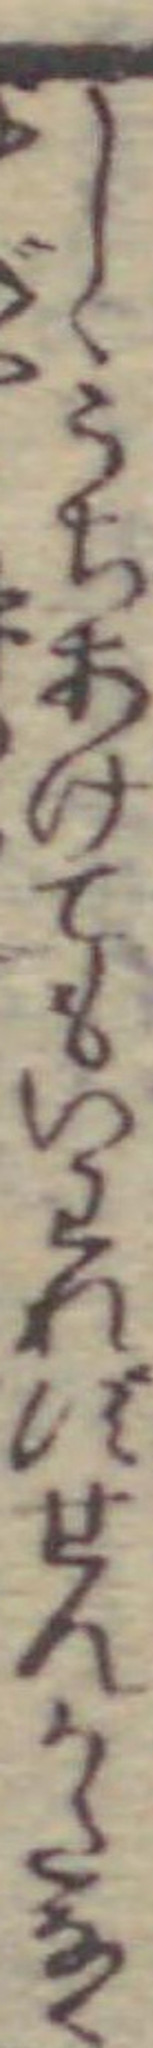しくうちあけてもいわれずせんかたなく
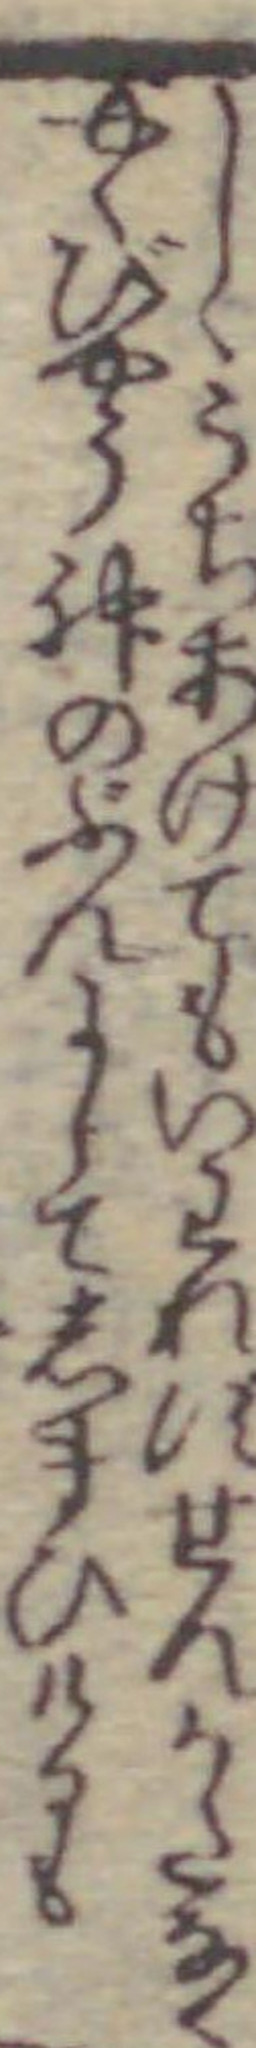やくびやう神のぶんにしてしまひけるも
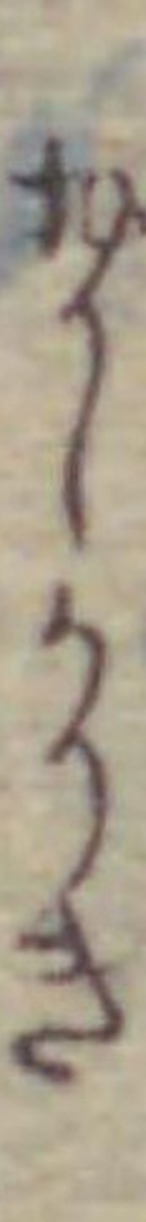おかしかりき
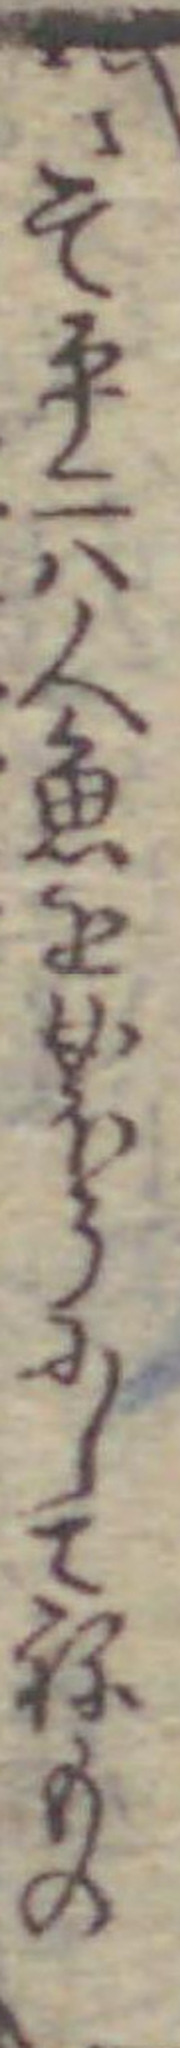〽さて平二は人魚を女ほうにしてねもの
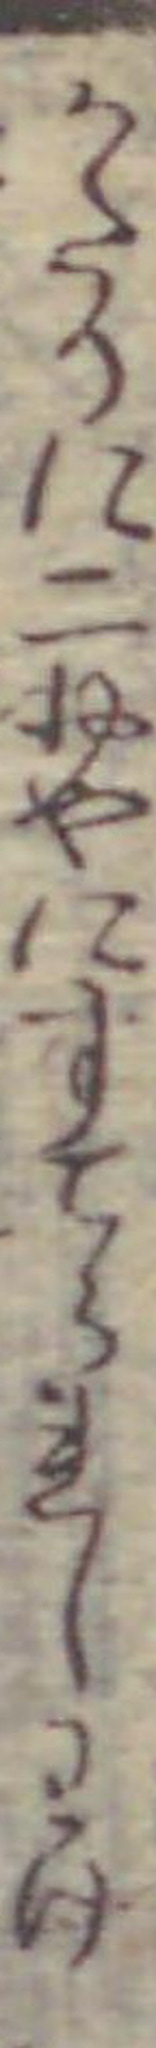かたりに二おやにすてられしわけ
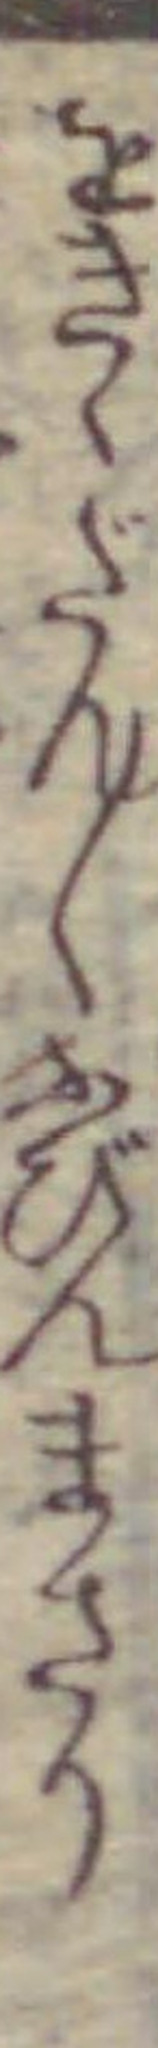をきくだん〳〵ふびんまさり
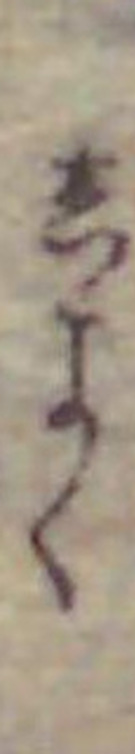しよく
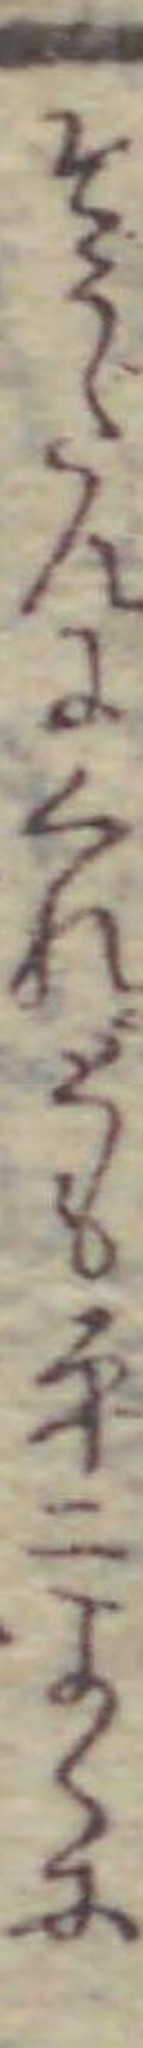そうだんにくれども平二よくに
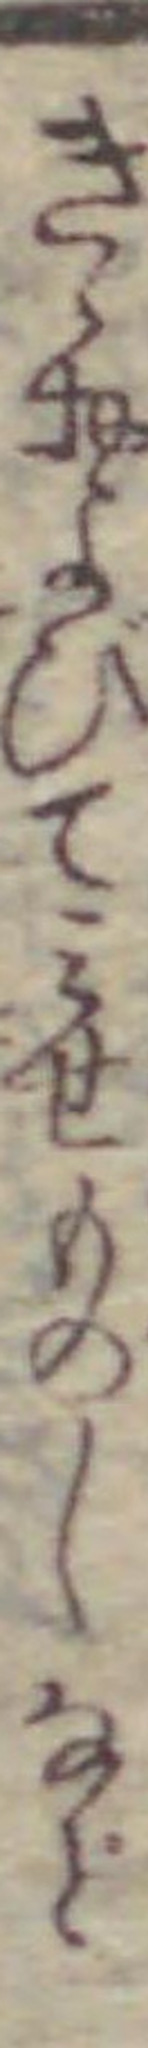きゝおよびてみせものしなど
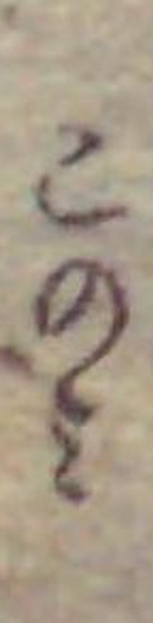このみ
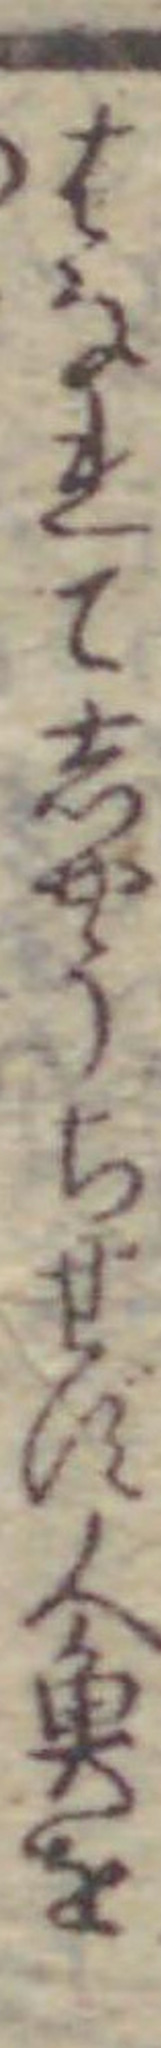はなれてしやうちせず人魚を
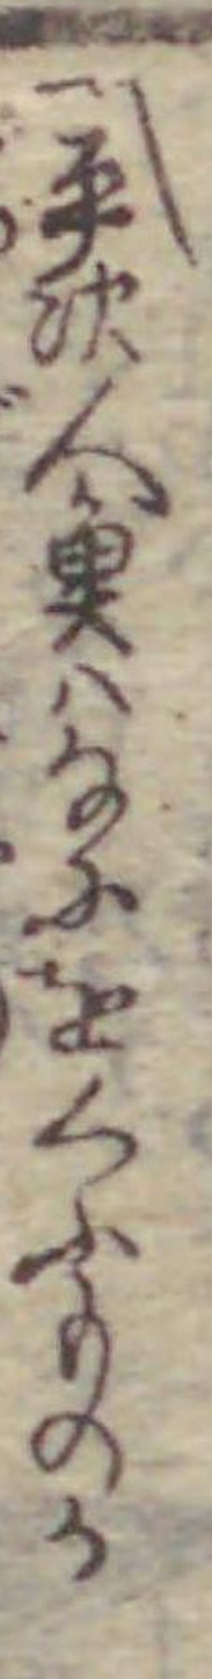〽平次人魚はなにをくふものか
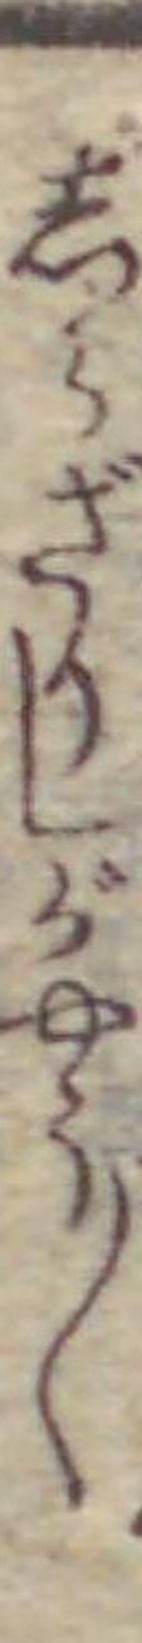しらざりしがやう〳〵
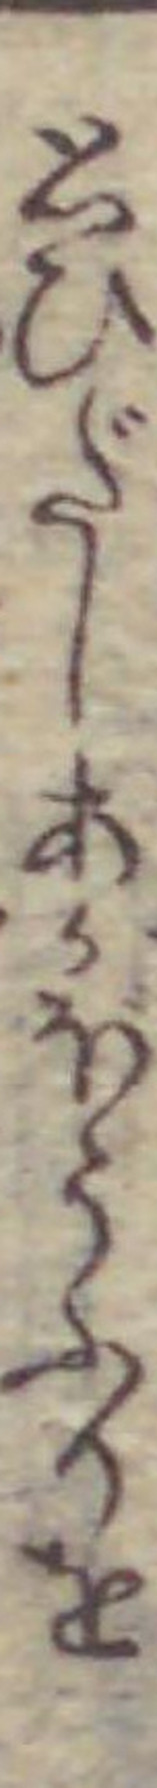とひだしあかぼうふりを
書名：箱入娘面屋人魚 3巻
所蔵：国立国会図書館 National Diet Library, JAPAN
